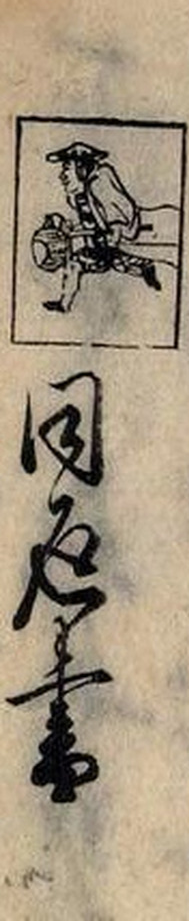同返書
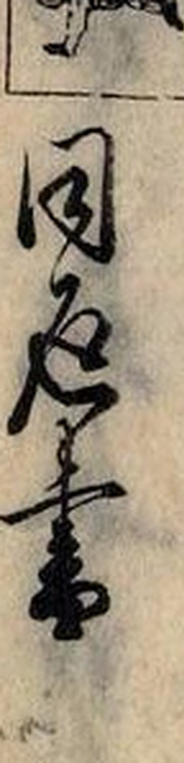同返書
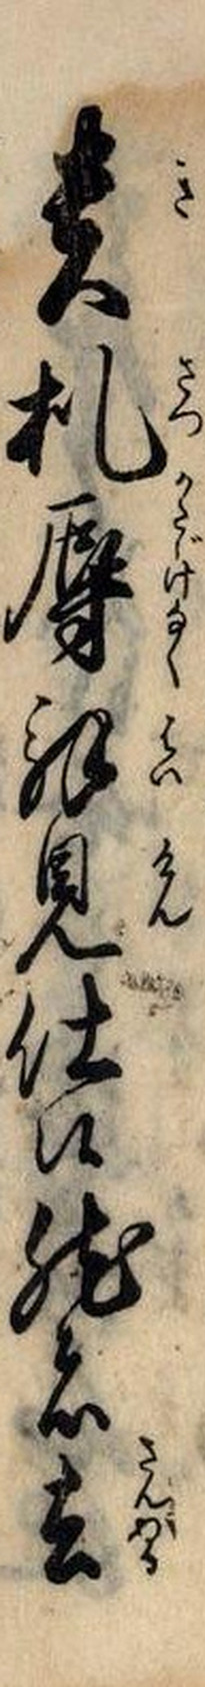貴札辱拝見仕候然者去
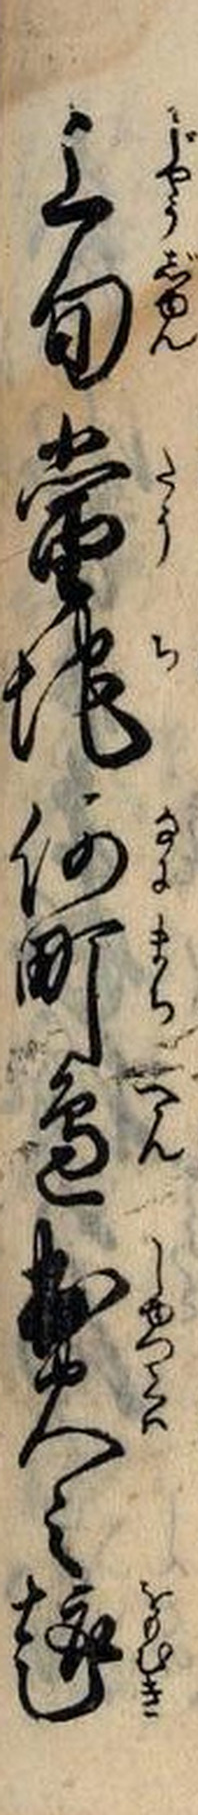上旬當地何町邊出火之趣
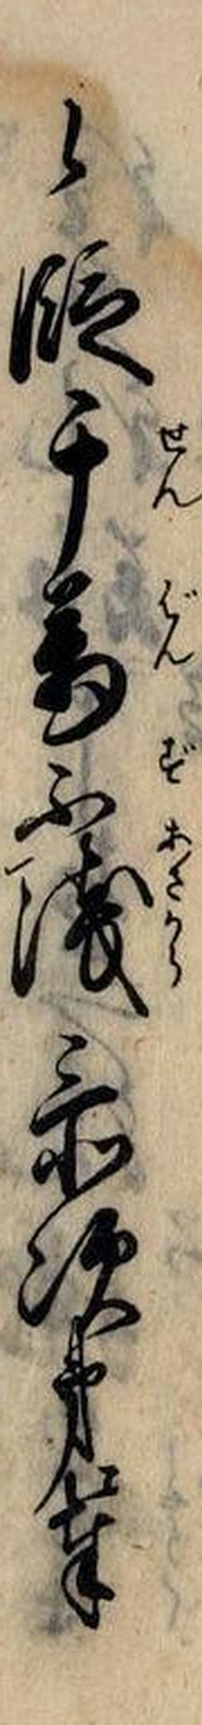候段千萬不浅忝次第に奉
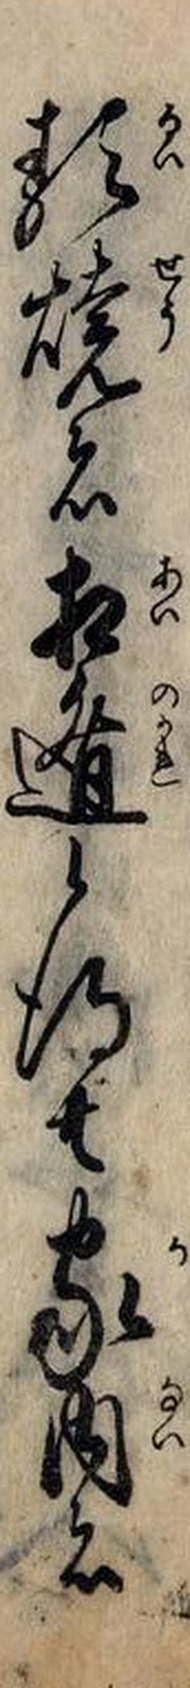類焼者相遁候得共家内者
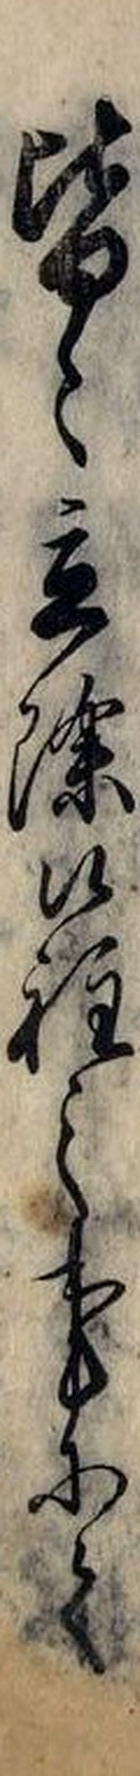皆々立除候程之事にて
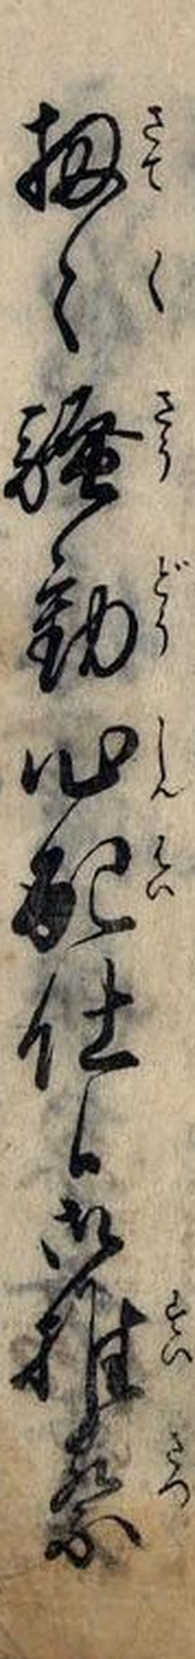扨々騒動心配仕候御推察

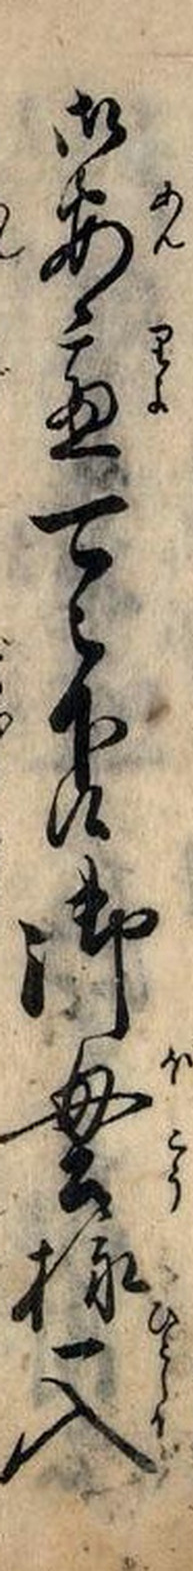御安慮可被下候御母公様一入
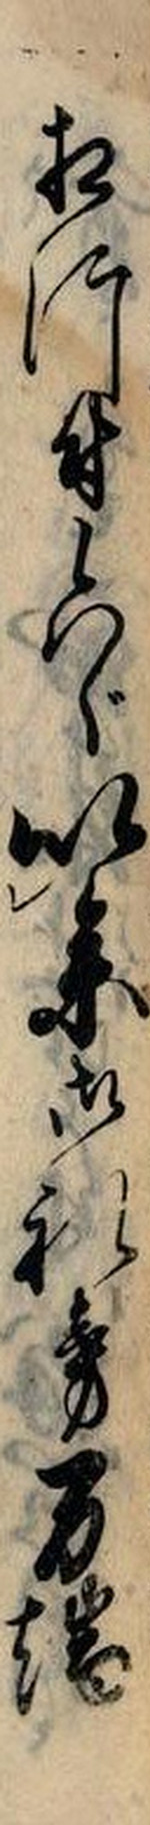相片付候はゞ以参御礼旁万端
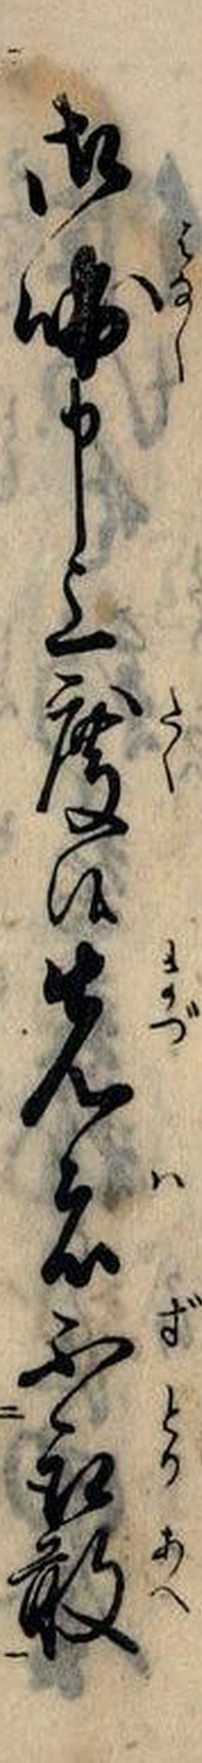御咄申上度候先者不取敢
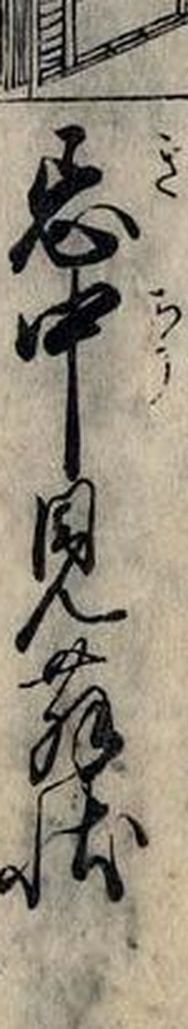忌中見舞状
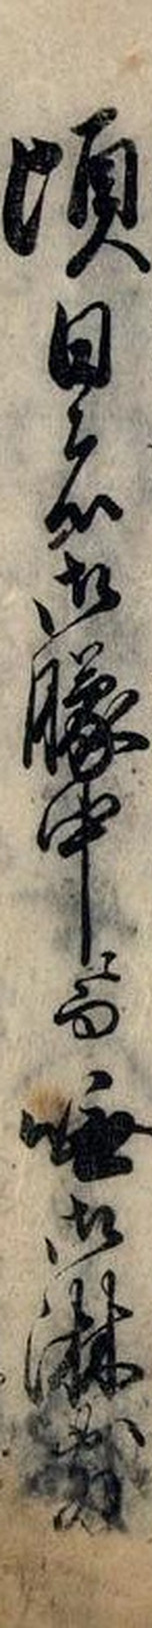頃日者御朦中に而嘸御淋敷

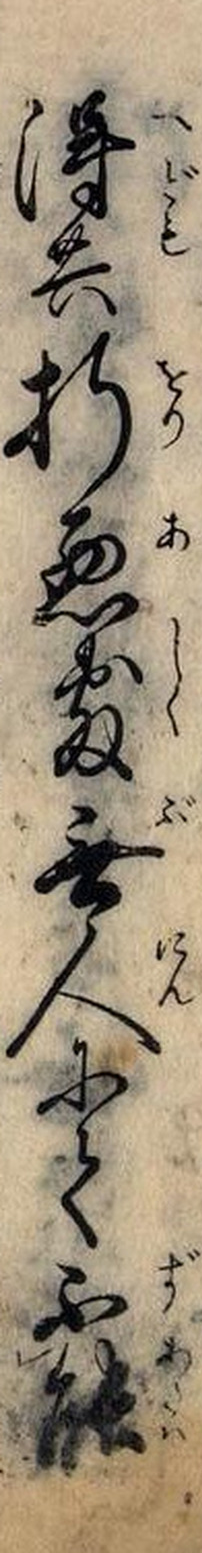得共折悪敷無人にて不能
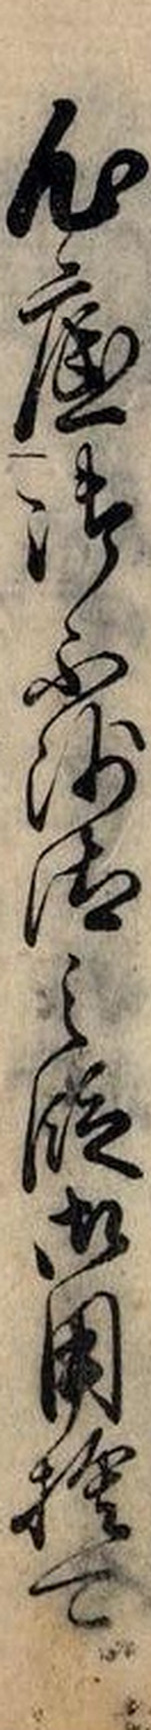心底御不沙汰之段御用捨可
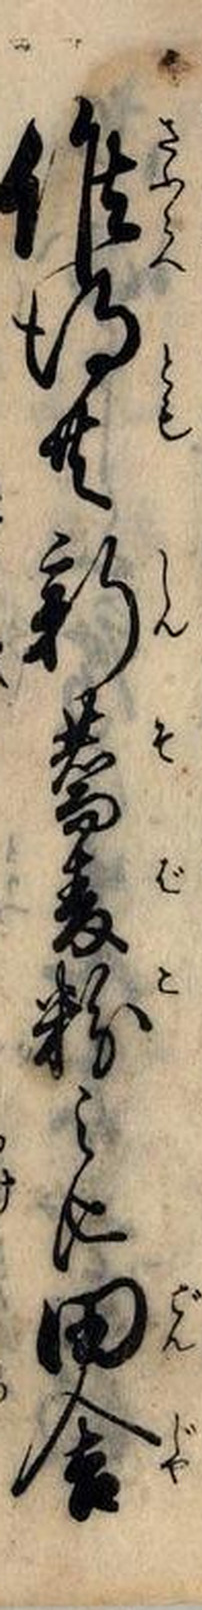候得共新蕎麦粉之由田舎
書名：大成用文章（往来物）
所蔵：福井県文書館 Fukui Prefectural Archives
